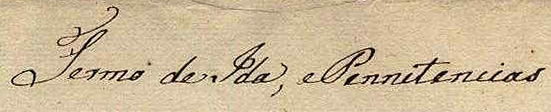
Termo de Ida, e Pennitencias
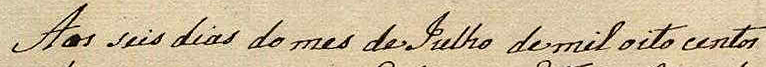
Aos seis dias do mes de Iulho de mil oitocentos
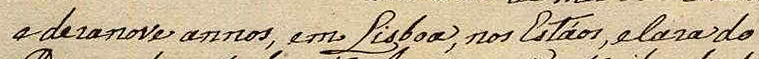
e dezanove annos, em Lisboa, nos Estáos, e Caza do
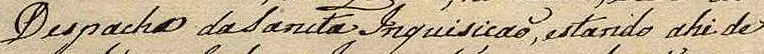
Despacho da Sancta Inquisiçaõ, estando ahi de
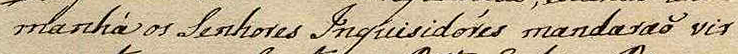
manhã os Senhores Inquisidores mandaraõ vir
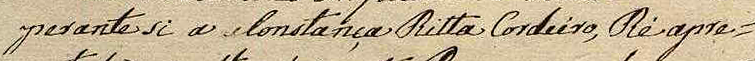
perante si a Constança Ritta Cordeiro, Ré apre
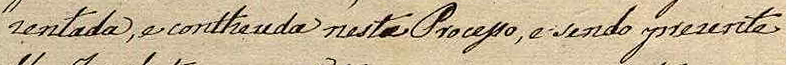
zentada, e contheuda nesta Processo, e sendo prezente
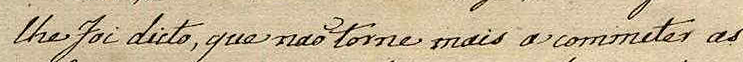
lhe foi dicto, que naõ torne mais a commeter as
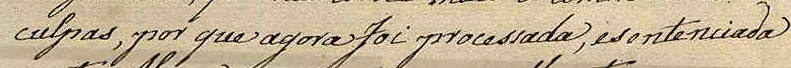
culpas, porque agora foi processada, e sentenciada
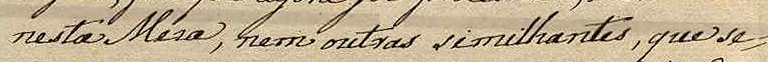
nesta Meza, nem outras similhantes, que se
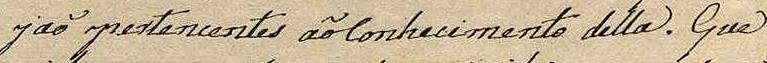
jaõ pertencentes aõ conhecimento della. Que
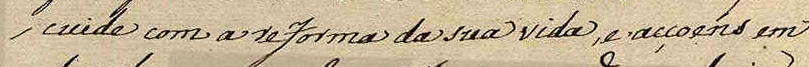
cuide com a reforma da sua vida, e acçoens em
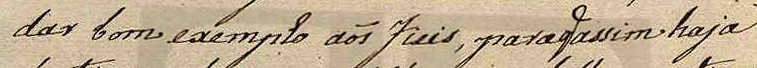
dar bom exemplo aós fieis, para q̄ assim haja
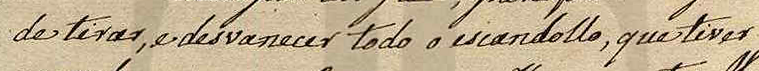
de tirar, e desvanecer todo o escandollo, que tiver
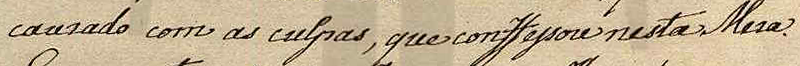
cauzado com as culpas, que conffessou nesta Meza.
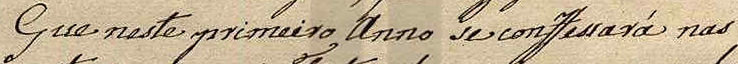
Que neste primeiro anno se conffessará nas
